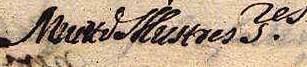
Muitto Illustres s.res
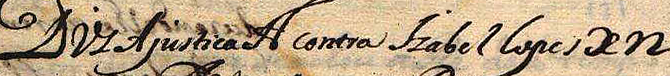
Diz A justica A contra Izabel lopes X N
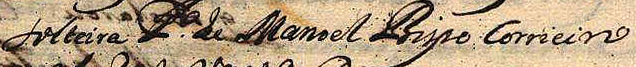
solteira f.a de Manoel Bispo corrieiro
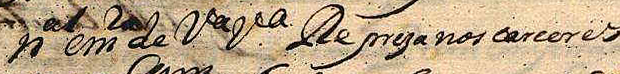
nal e mra de Va V.a Re preza nos carceres
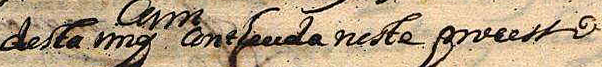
desta imqcam contheuda neste processo
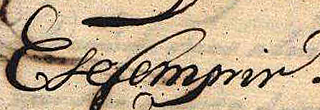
E se Comprir.
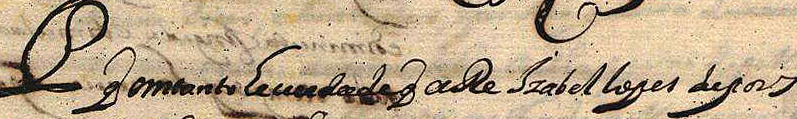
P q̄ em tanto he uerdade q̄ a Re Izabel lopes depois
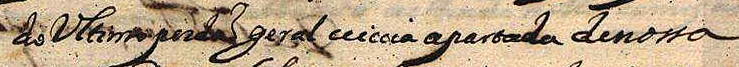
do Vltimo perdaõ geral uiuia apartada de nossa
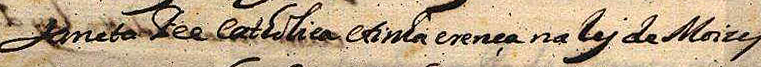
Sancta Fee catholica e tinha crença na lej de Moizes
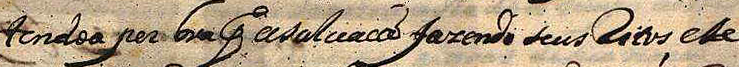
tendoa per boa pa a saluacā fazendo seus Ritos, e Se
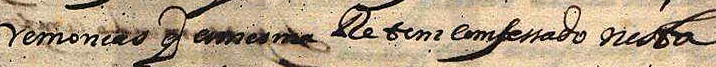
remonias q̄ a mesma Re tem comfessado nesta
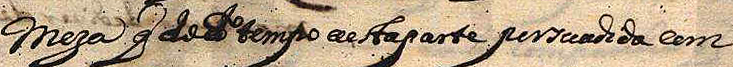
meza q̄ do d̄o tempo a esta parte persuadida com
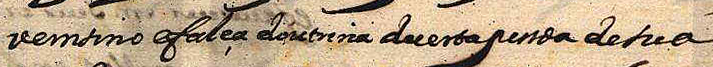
o emsino e falça doutrina de certa pessoa de sua
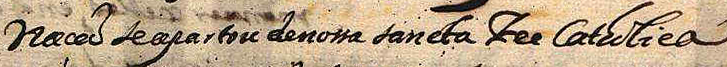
Naçā se apartou de nossa sancta Fee Catholica
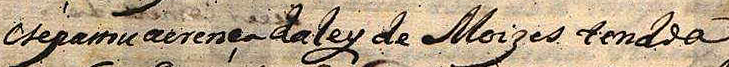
e se passou a crença da ley de Moizes tendoa
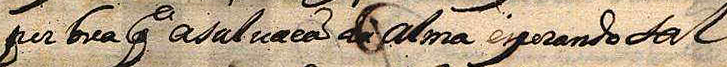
per boa pa a saluacā da alma esperando Sal
